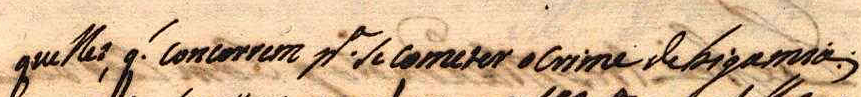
quelles, q̄ concorrem p.a se cometer o crime de bigamia.
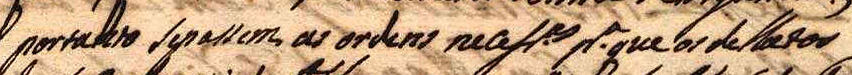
portanto se passem as ordens necess.as p.a que os dellatos
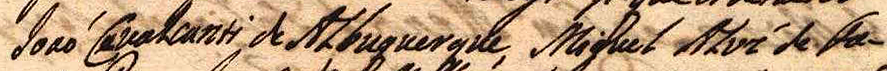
Ioaõ Cavalcanti de Albuquerque, Miguel Alvz̄ de Fa
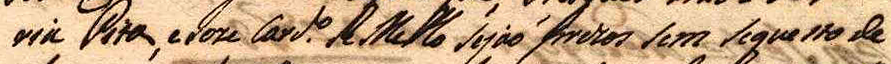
ria Pita, e Ioze Card.o de Mello sejaõ prezos sem sequesto de
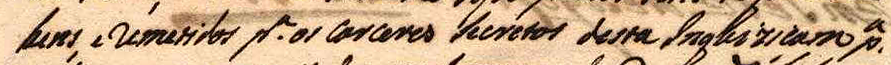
bens, e Remetidos p.a os carceres secretos desta Inquiziçam p.a
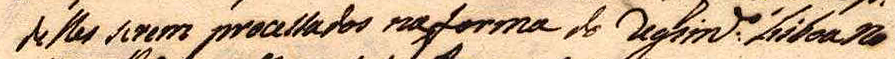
delles serem processados na forma do Regim.to Lisboa no
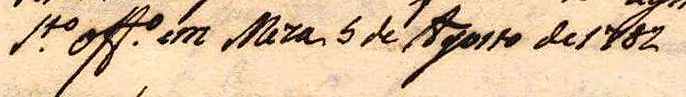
s.to off.o em Meza 5 de Agosto de 1782
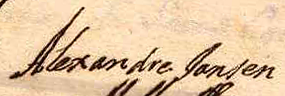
Alexandre Jansen
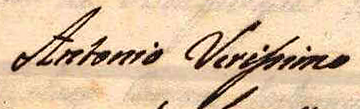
Antonio Verissimo
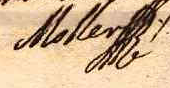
Moller
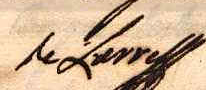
de Larre
